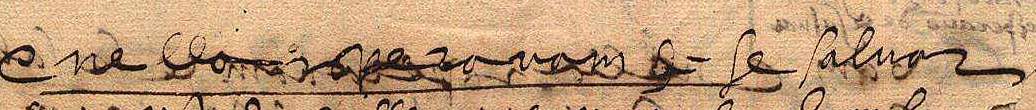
e nella esperauam de se saluar
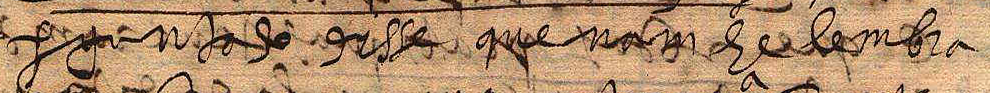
ꝑguntado disse que nam he lembra
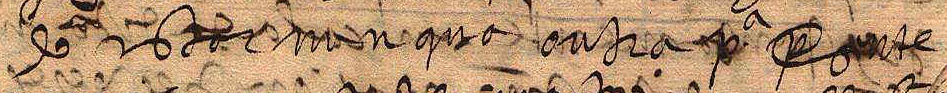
do estar nunqua outra pa p̄sente
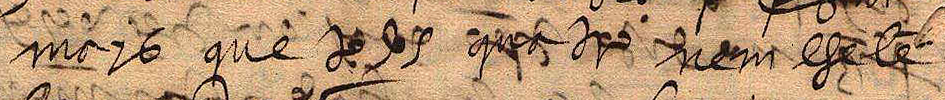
mays que todos quatro nem lhe lē
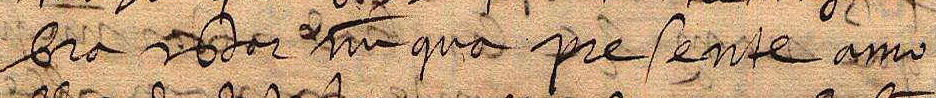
bra estar nūqua presente a mo
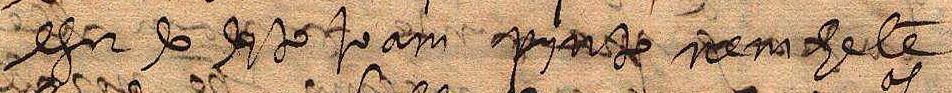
lher do dyto Joam pynto nem he lē
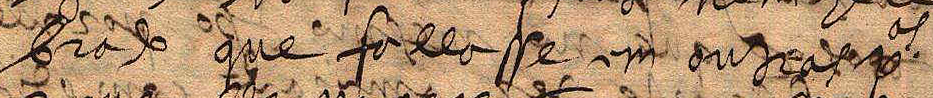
brado que fallase em outras pas.
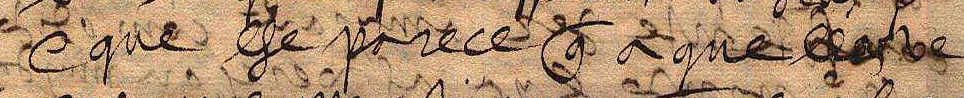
e que lhe parece q̄ aquellas ve
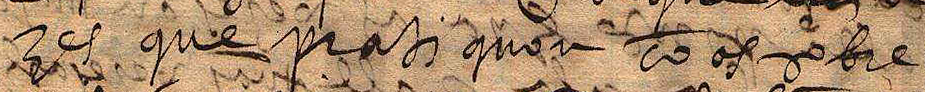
zes que pratjquou cō os sobre
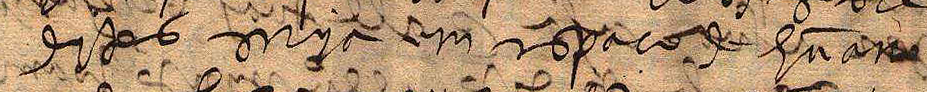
dytos serya em espaço de hū ano
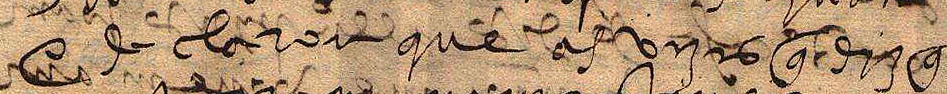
e declarou que as vezes q̄ dyz q̄
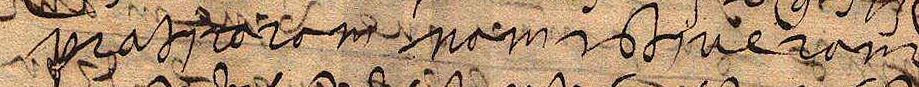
pratycaram nam estjueram
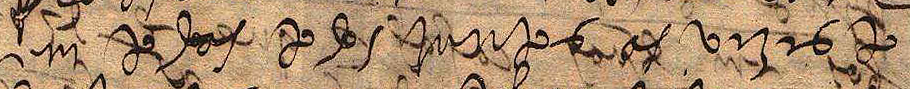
em todas todos Juntos as vezes to
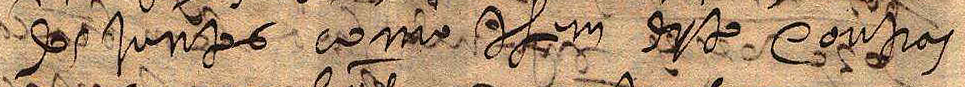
dos Juntos como them dyto e outras
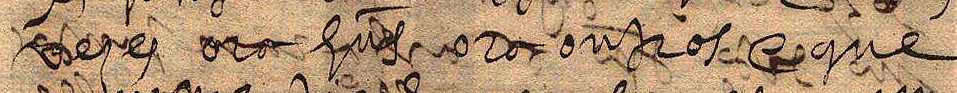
vezes ora hūs ora outros e que
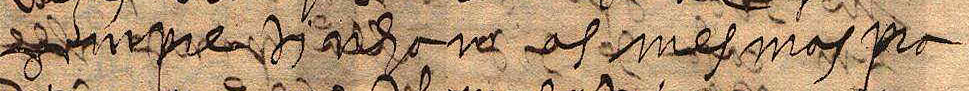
sempre tynham as mesmas pra
